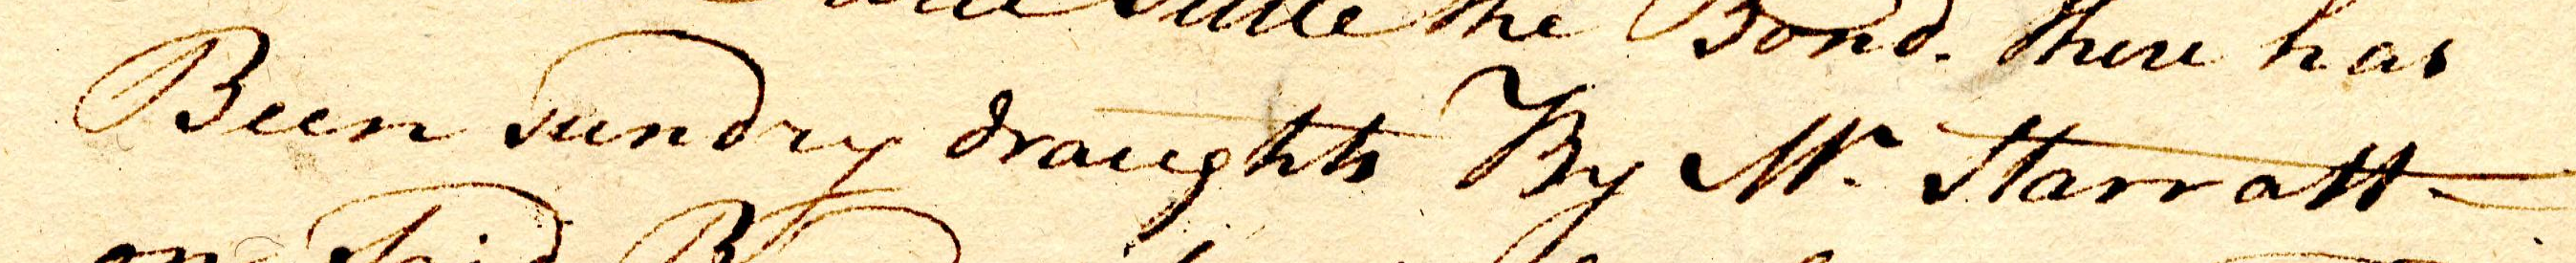Been sundry draughts By M^r. Starratt-
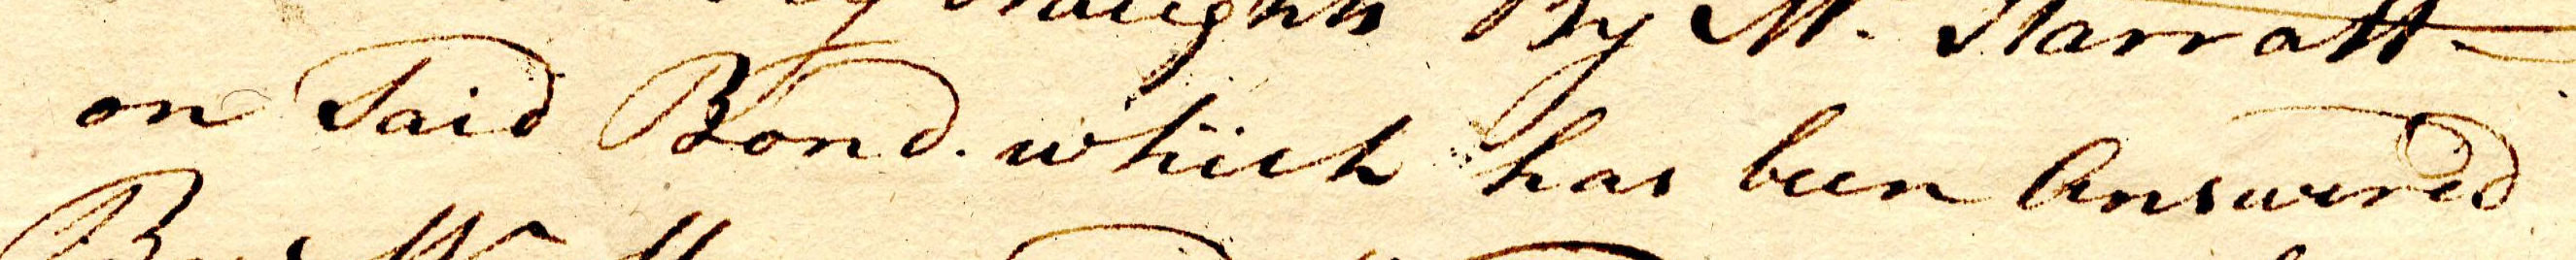on said Bond which has been Answered
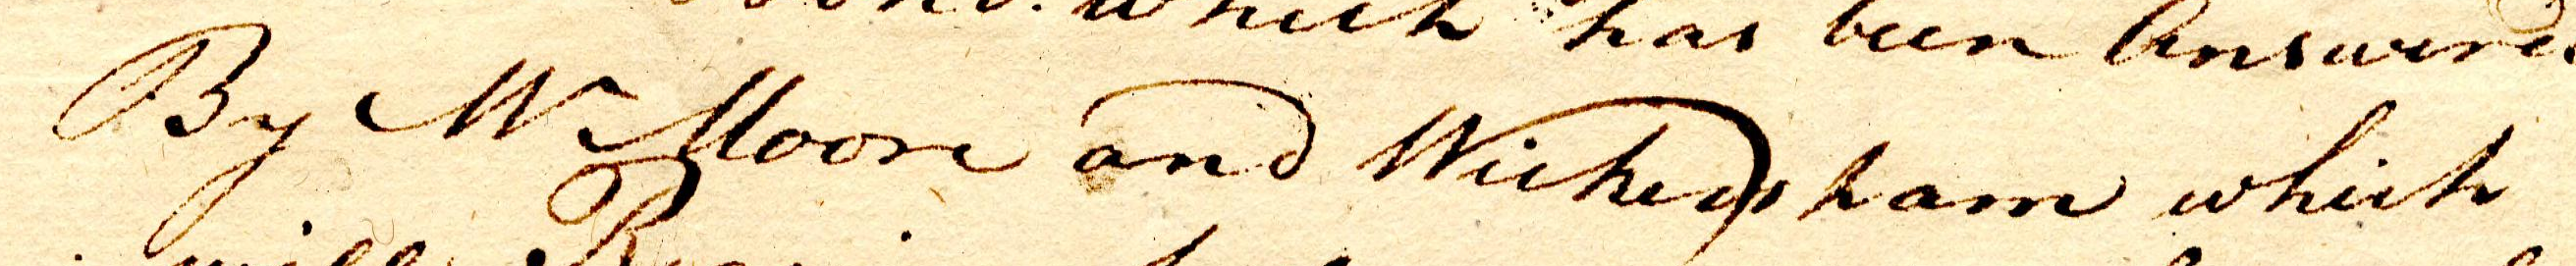By M^r Moore and Wickersham which
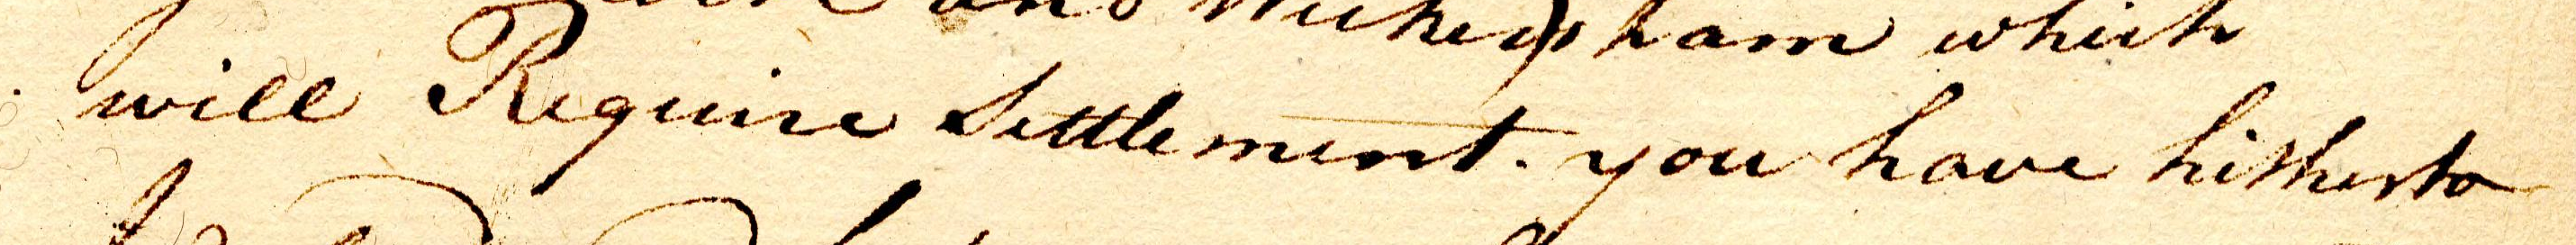will Require Settlement you have hitherto
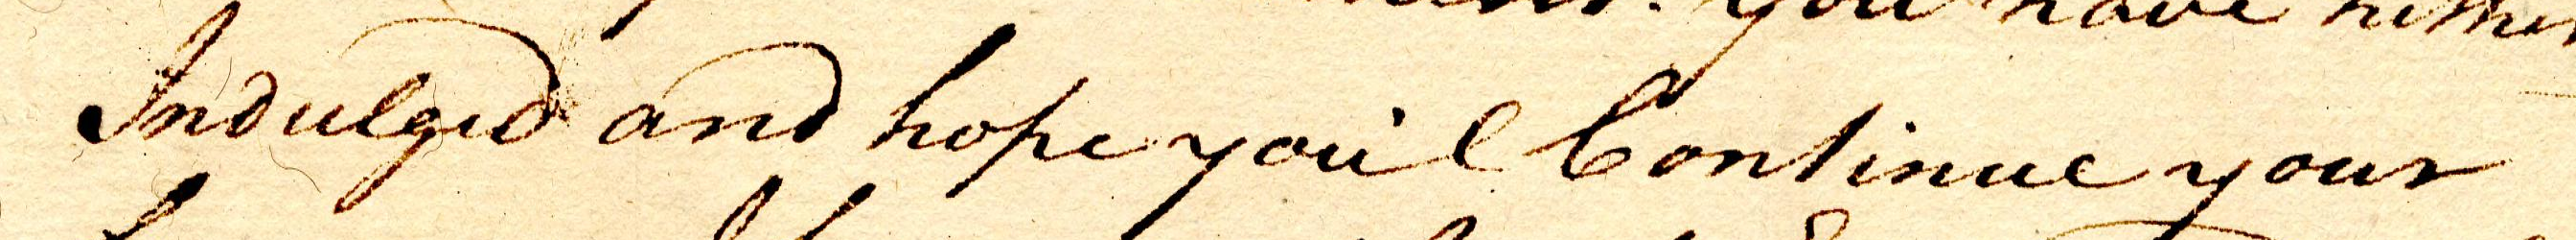Indulged and hope you Continue your
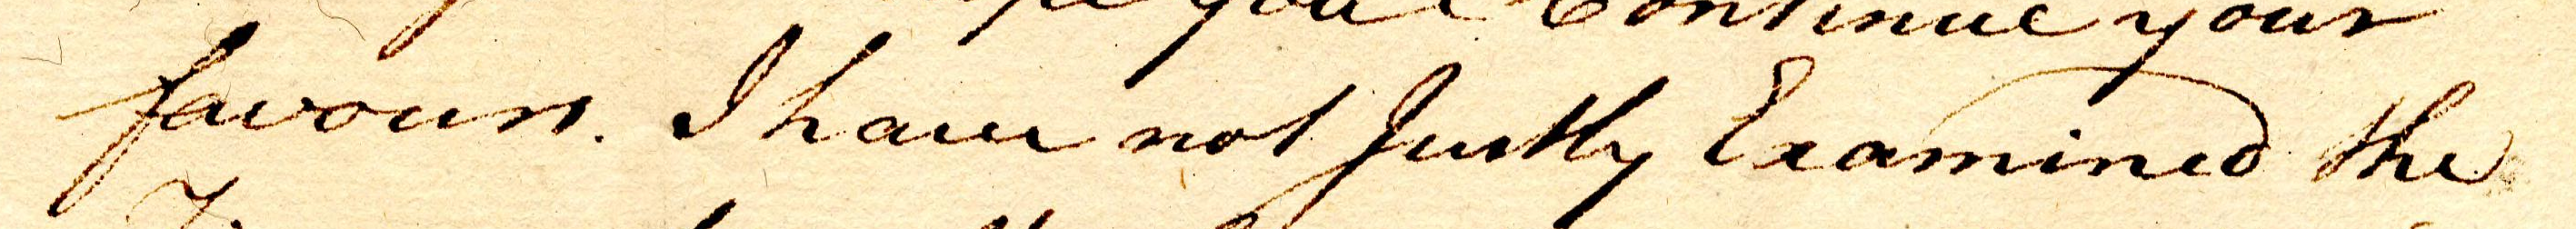favours. I have not Justly Examined the
